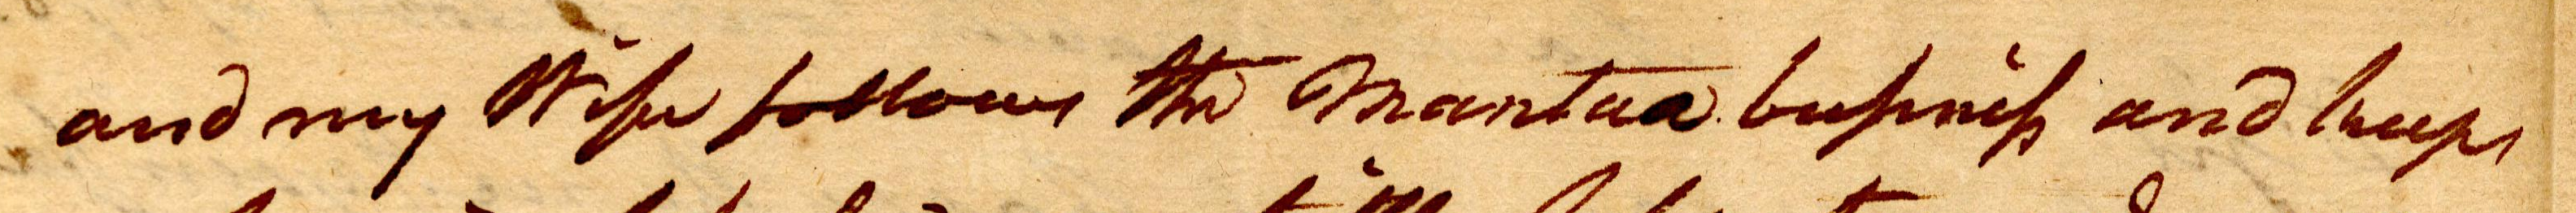and my Wife follows the mantua business and keeps
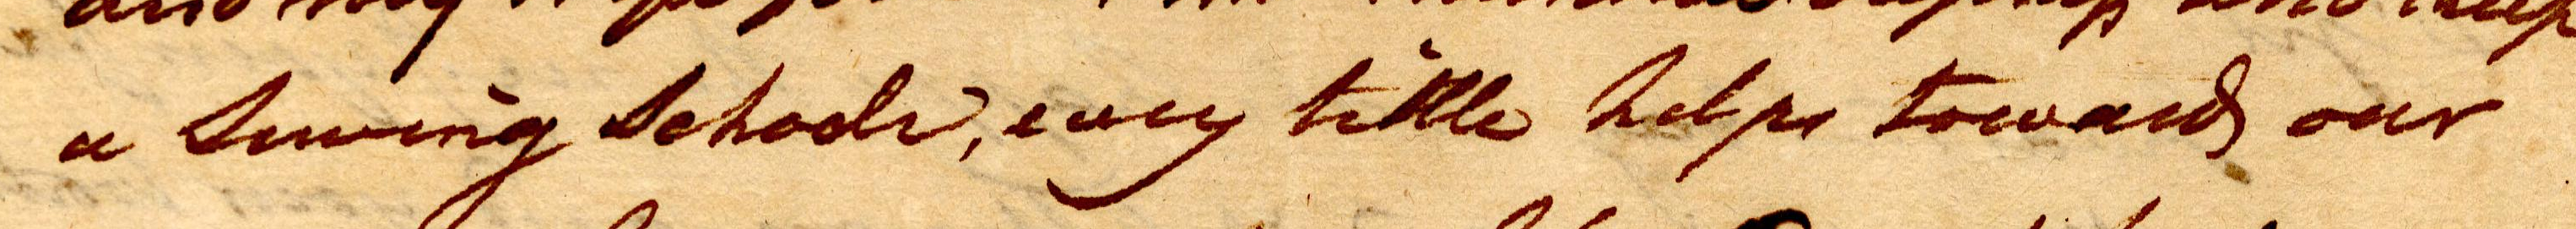a sewing Schools, every title helps towards our
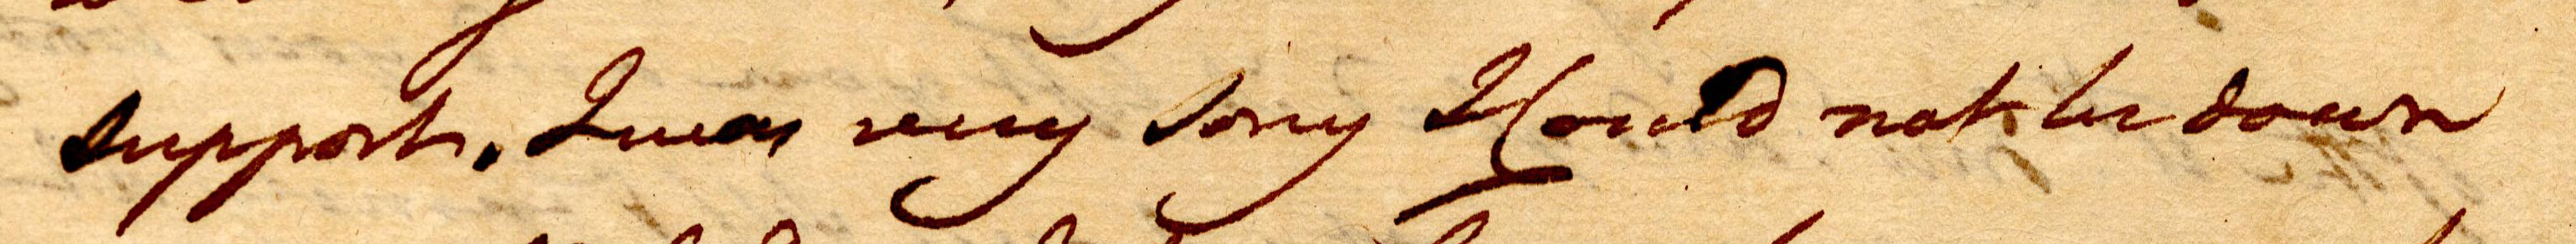suppport. I was very sorry I Could not be down
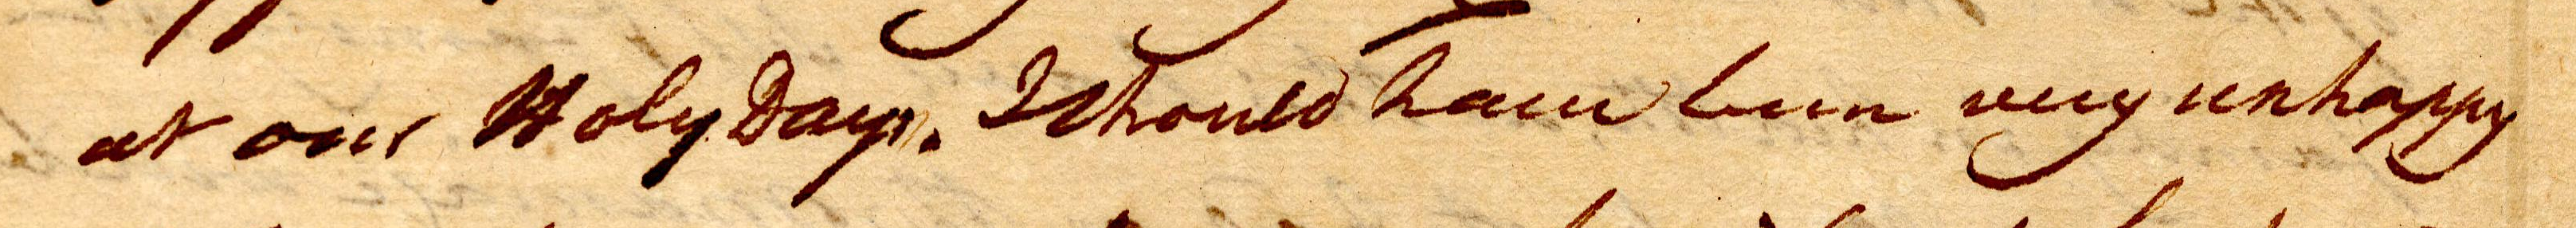at our Holy days. I should have been very unhappy
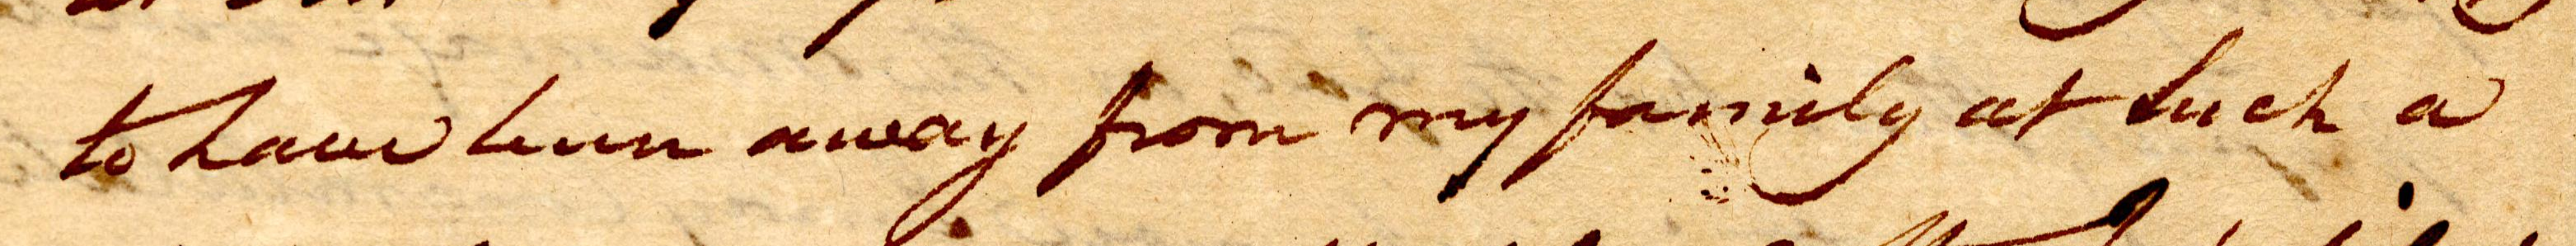to have been away from my family at such a
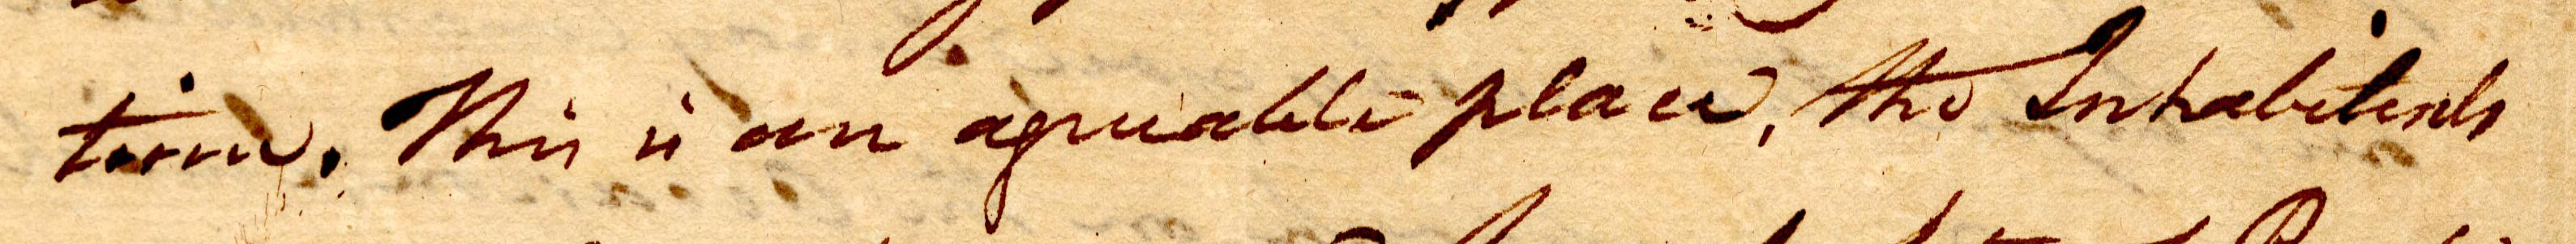time. This is an agreable place, the Inhabitents
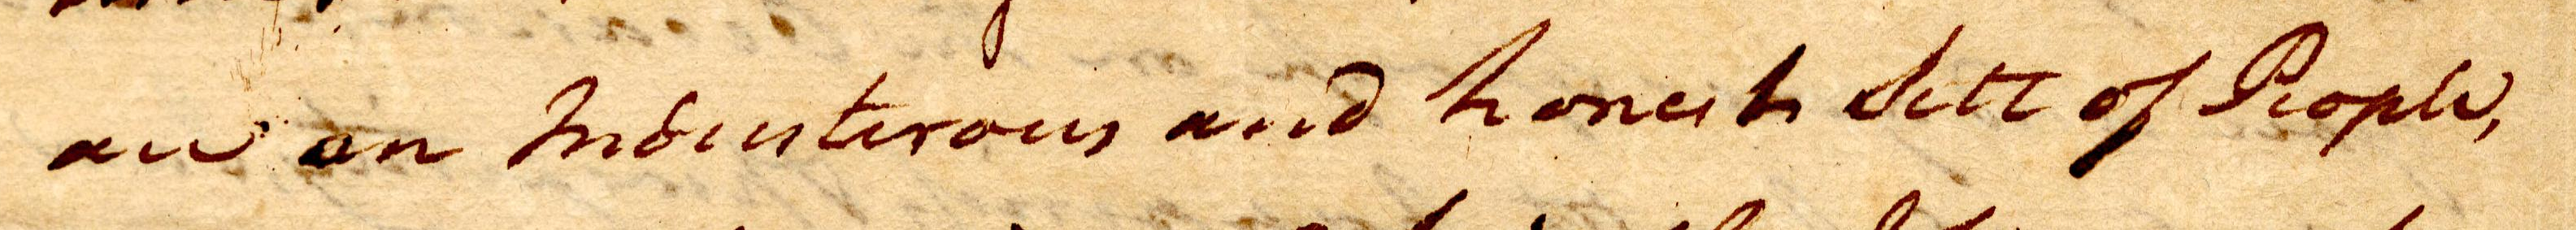are an industrious and honest sort of People,
